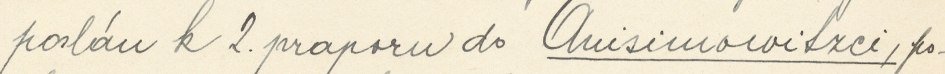poslán k 2. praporu do Anisimowitzci, po-
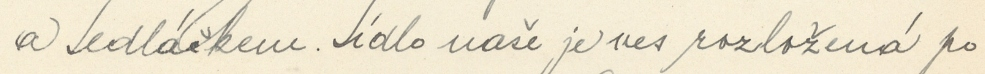a Sedláčkem. Sídlo naše je ves rozložená po
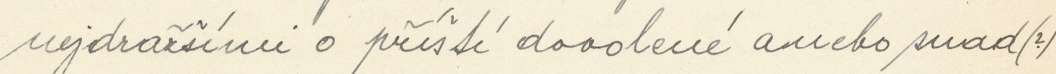nejdražšími o příští dovolené anebo snad (?)
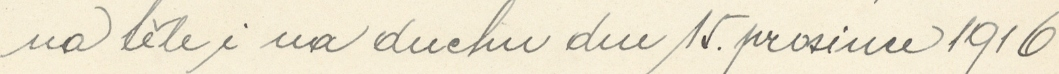na těle i na duchu dne 15. prosince 1916.
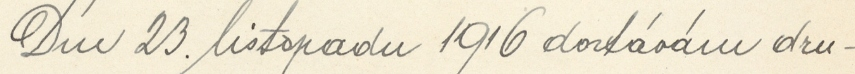Dne 23. listopadu 1916 dostávám dru-
